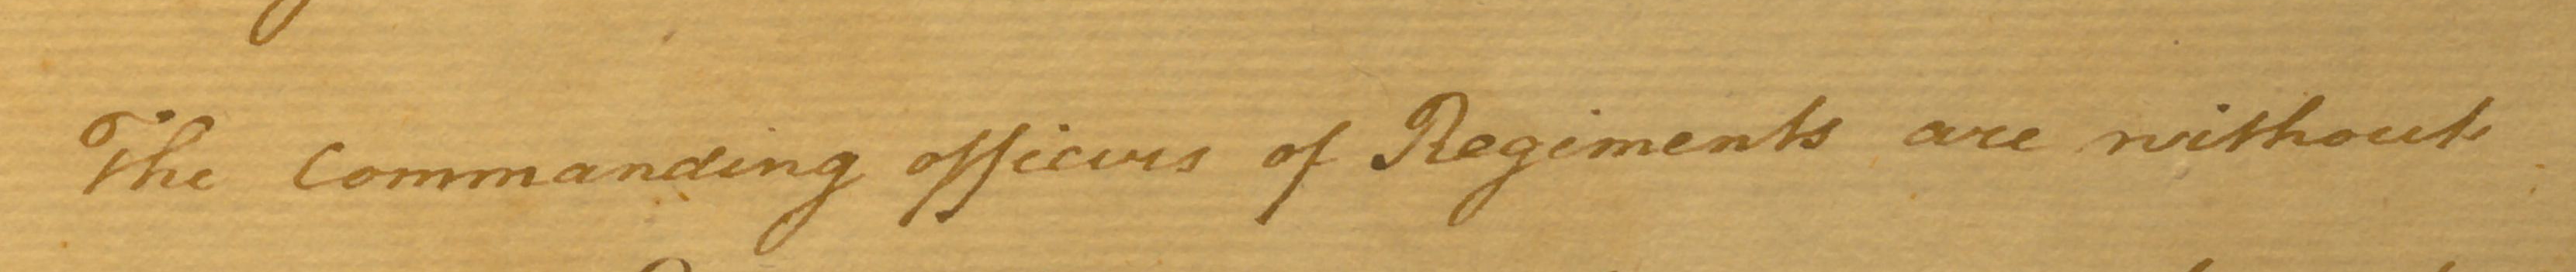The Commanding officers of Regiments are without
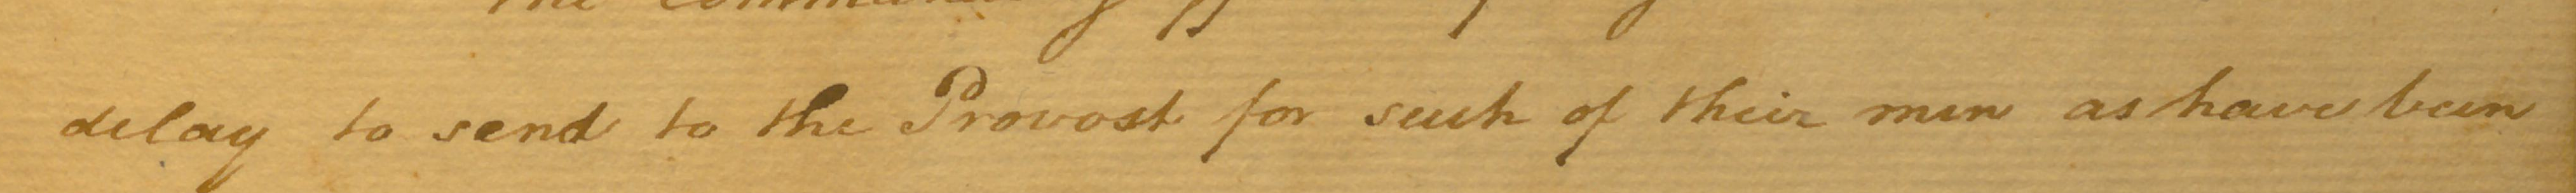delay to send the Provost for such of their men as have been
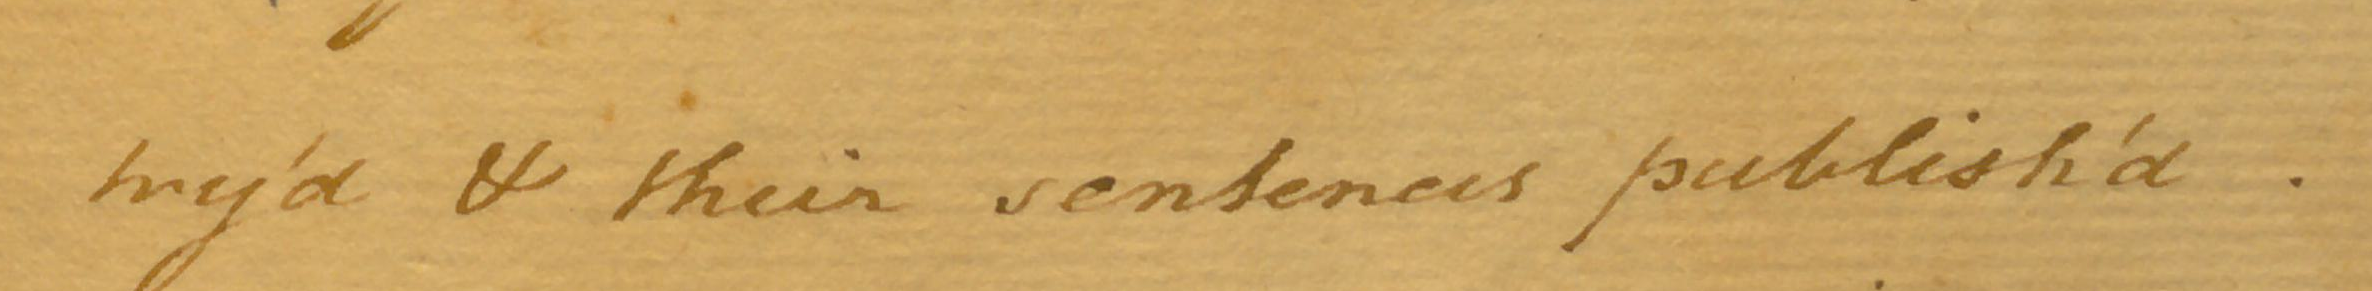try'd & their sentences publish'd.
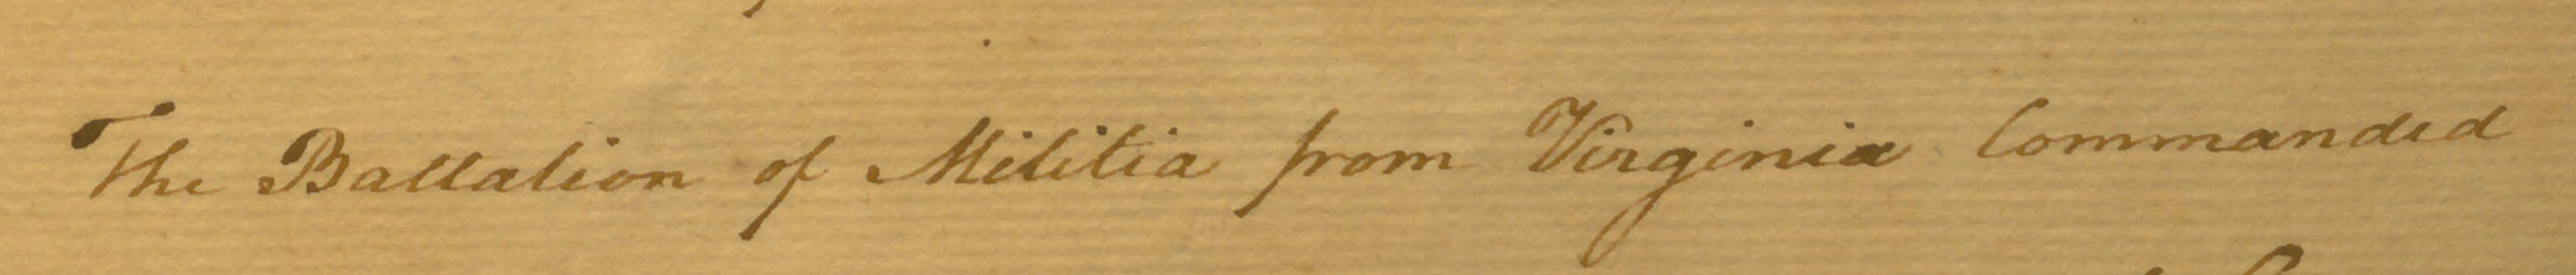The Battalion of Militia from Virginia Commanded
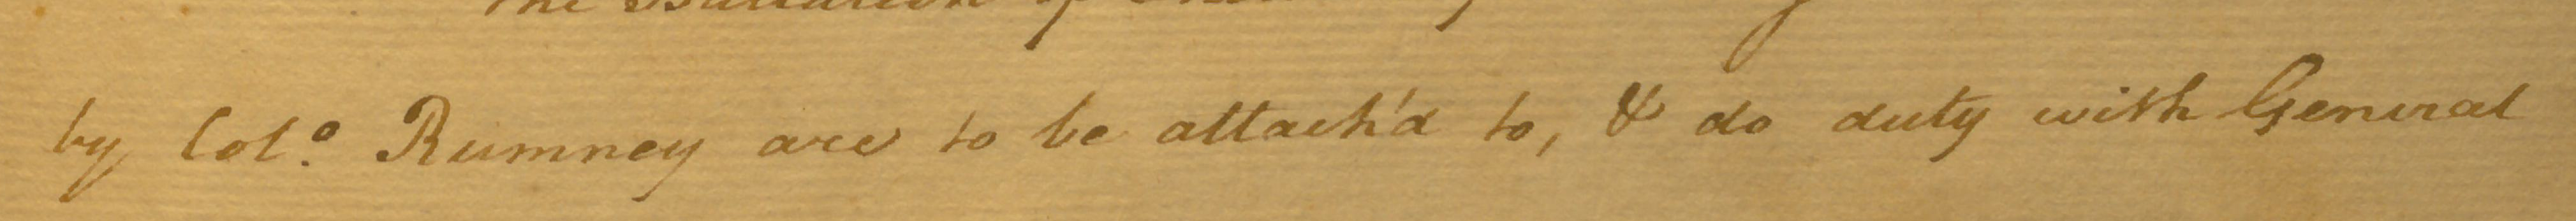by Col^o. Rumney are to be attach'd to, & do duty with General
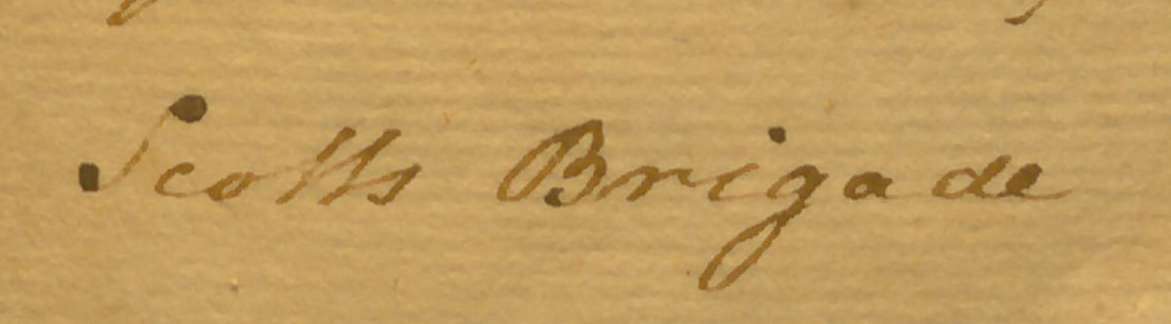Scotts Brigade
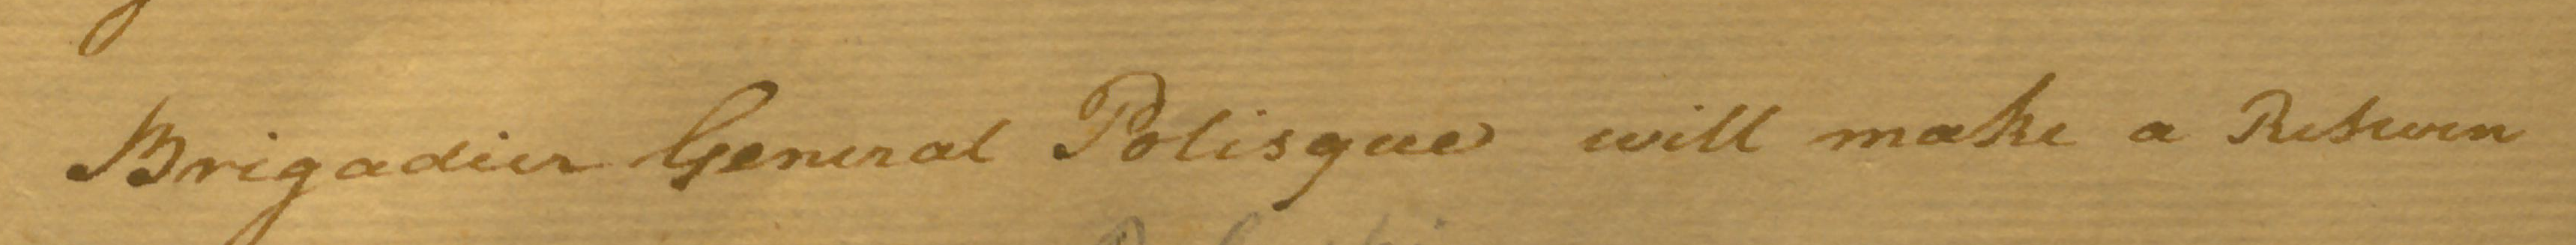Brigadier General Polisque will make a Return
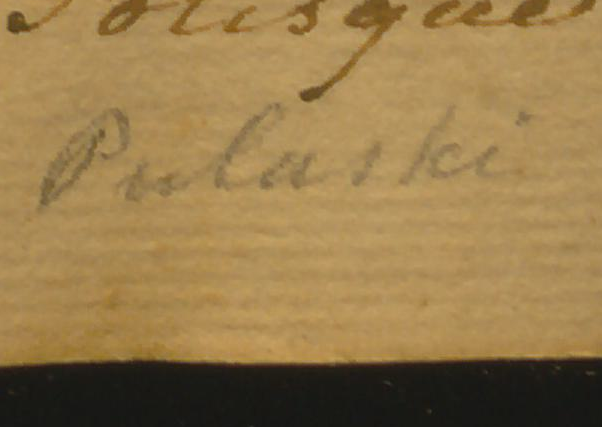Pulaski
